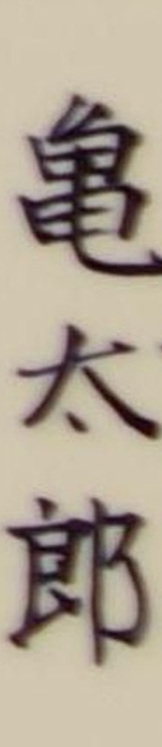亀太郎
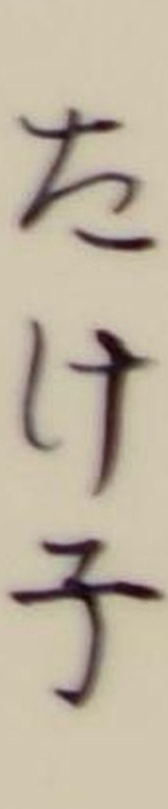たけ子
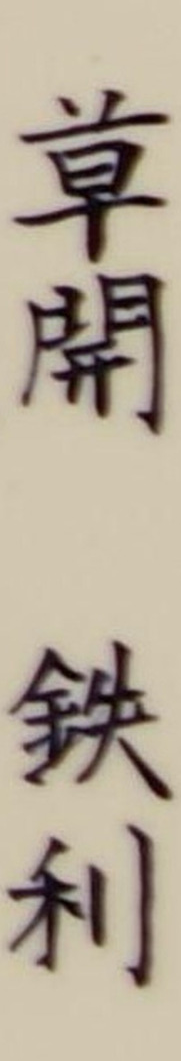草開鉄利
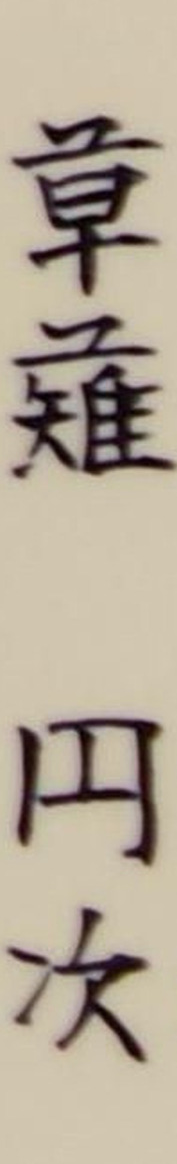草薙円次
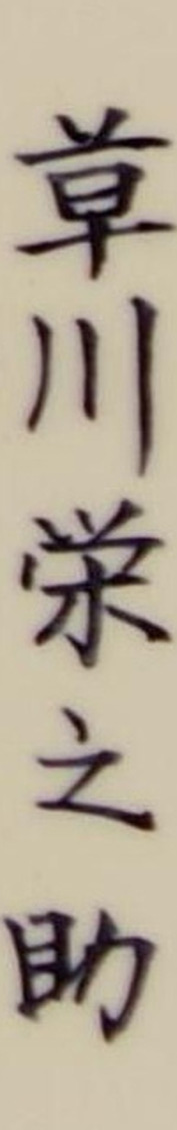草川栄之助
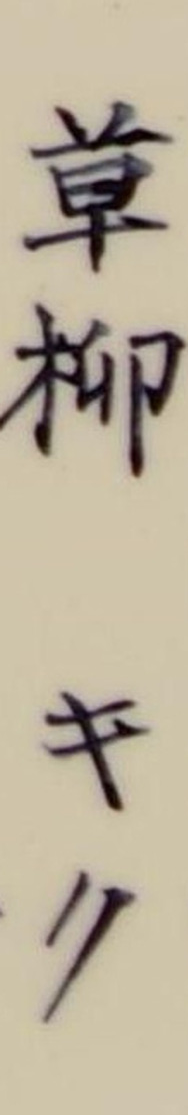草柳キク
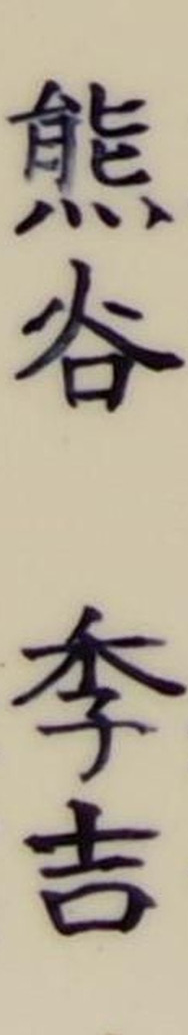熊谷李吉

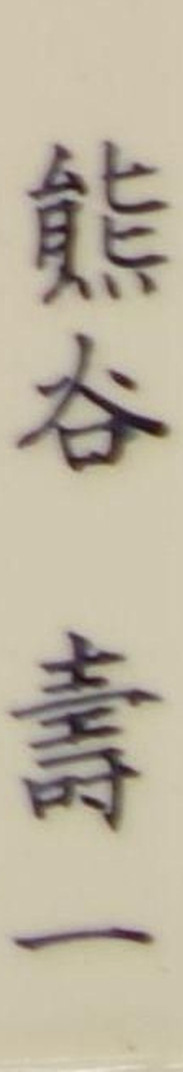熊谷壽一
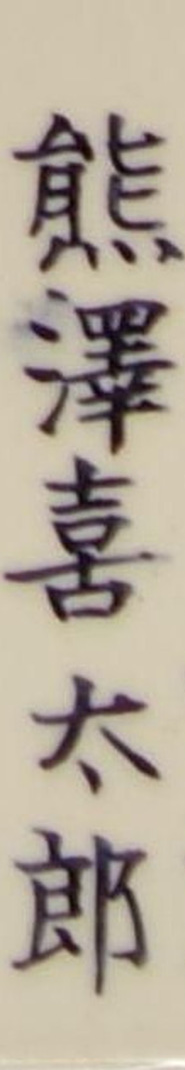熊澤喜太郎
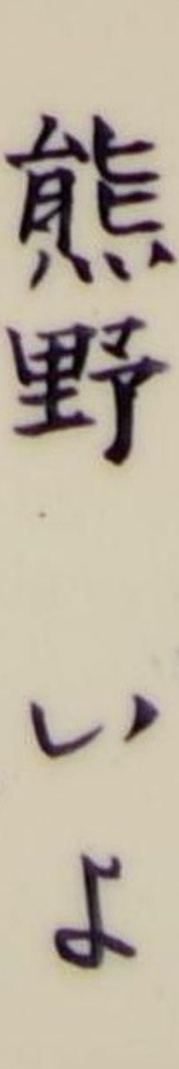熊野いよ
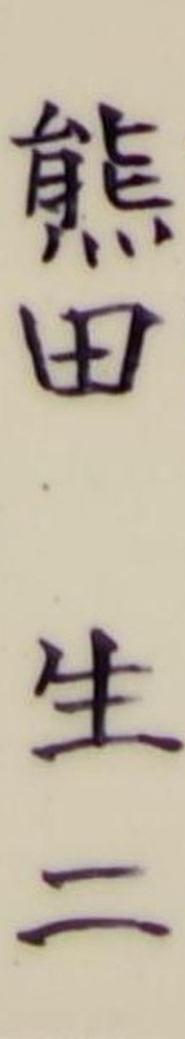熊田生二
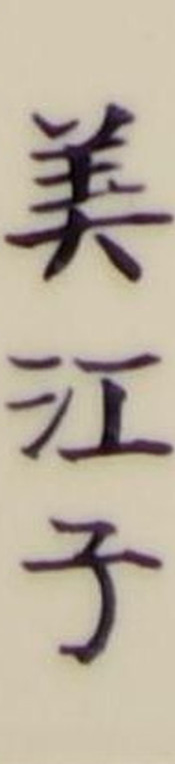美江子
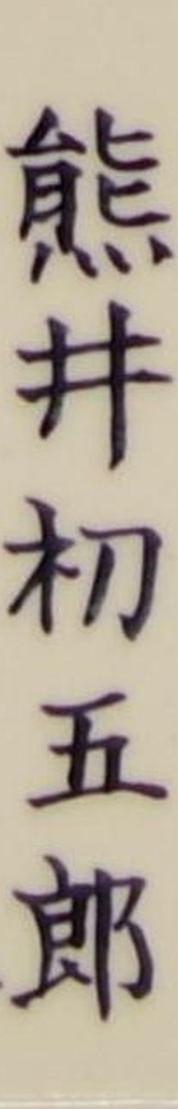熊井初五郎
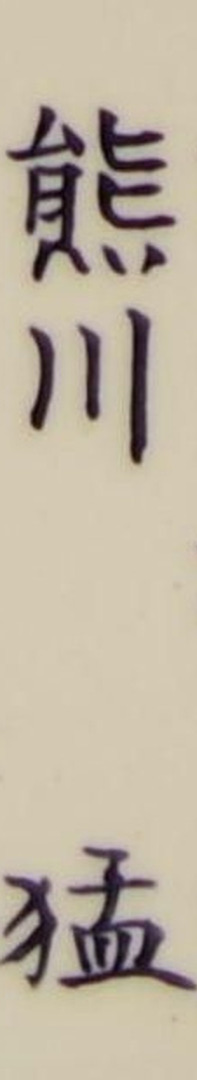熊川猛
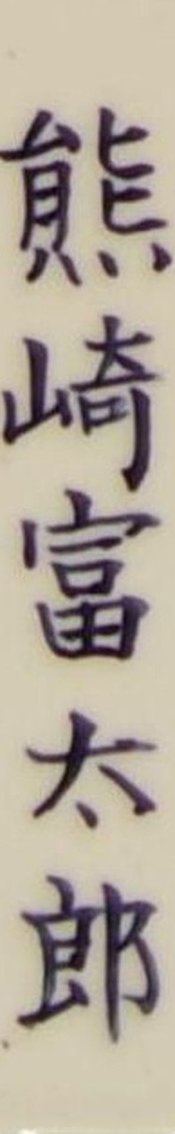熊崎富太郎
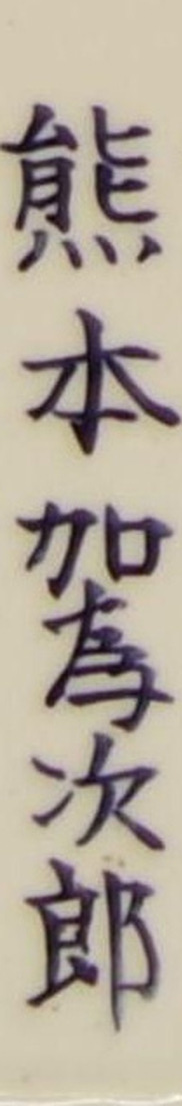熊本加為次郎
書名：A~D
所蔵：koyasan kongobuji
